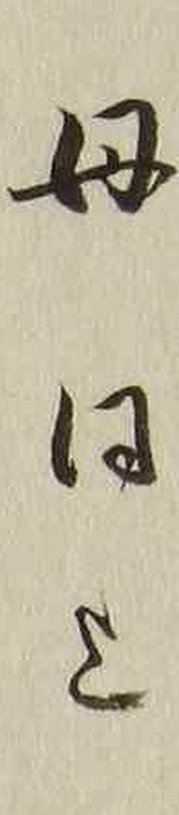母同上
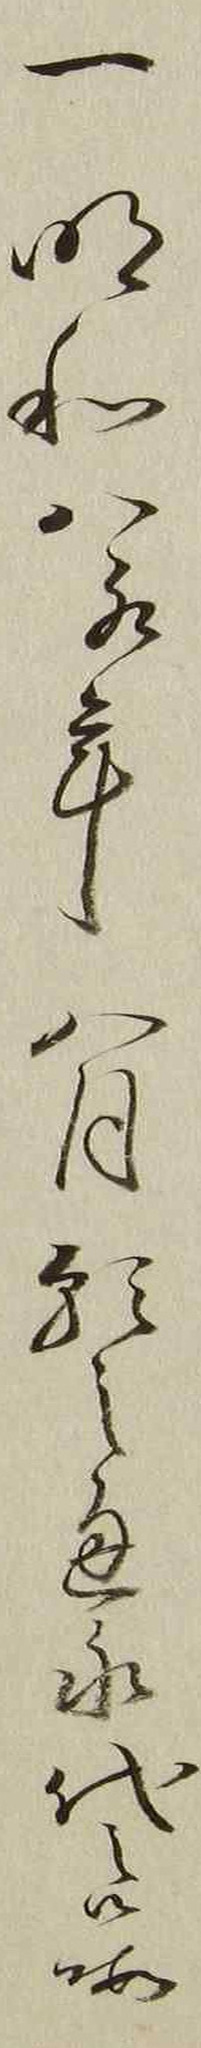一明和八卯年八月願い之通り永代之御暇
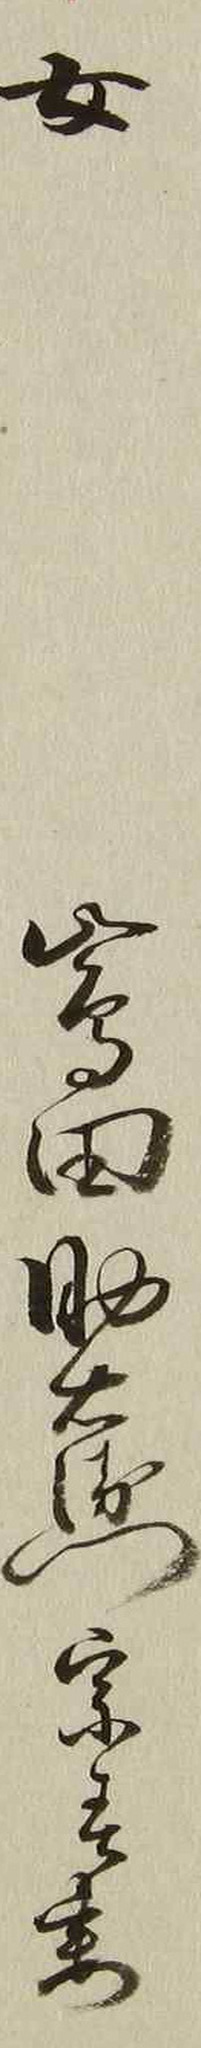女嶌田助右衛門宗春妻
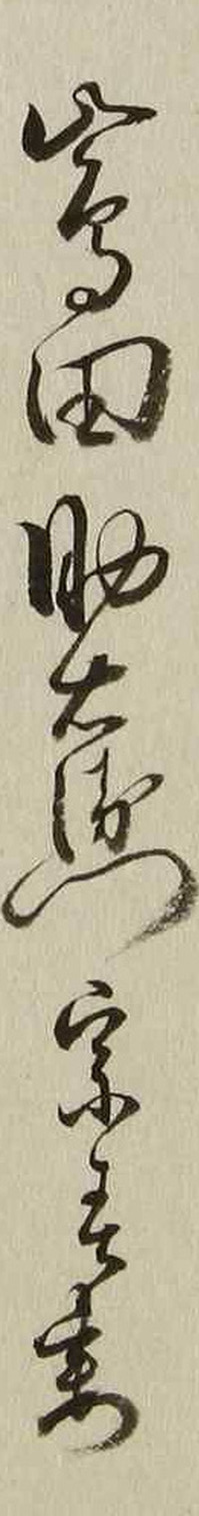女嶌田助右衛門宗春妻
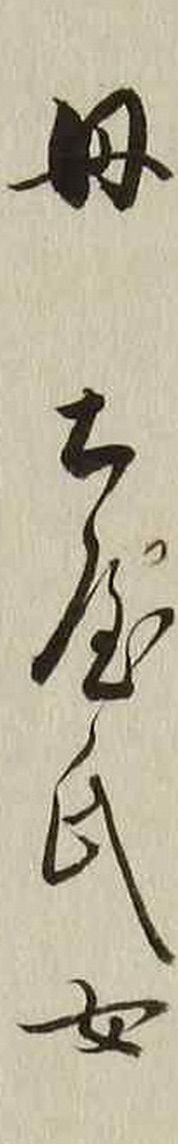母土屋氏女
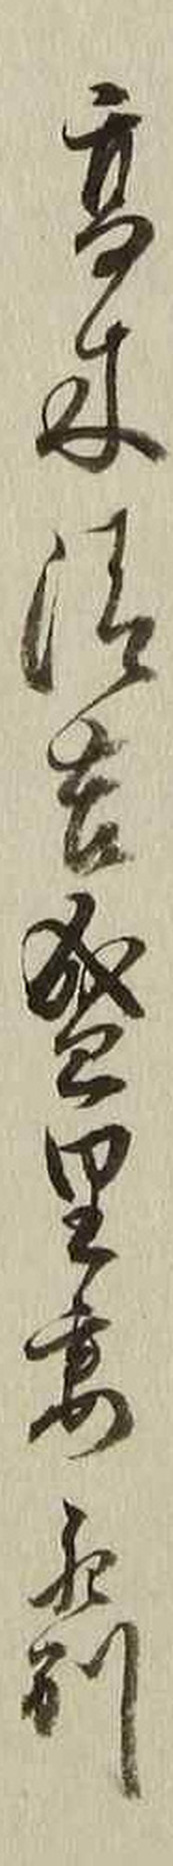高木清吉盛里妻死別
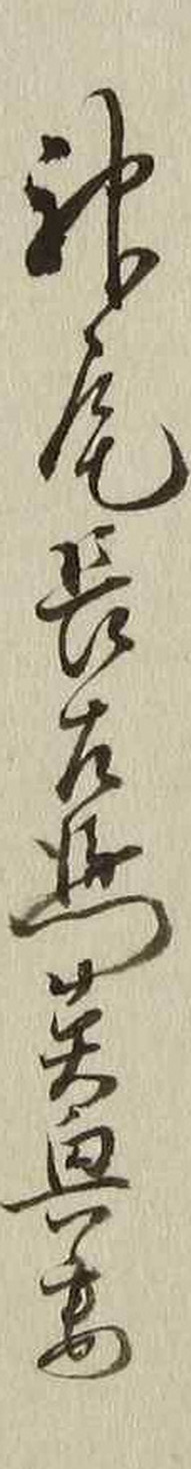女神尾長左衛門芙興妻
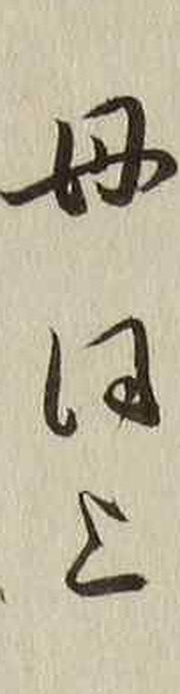母同上
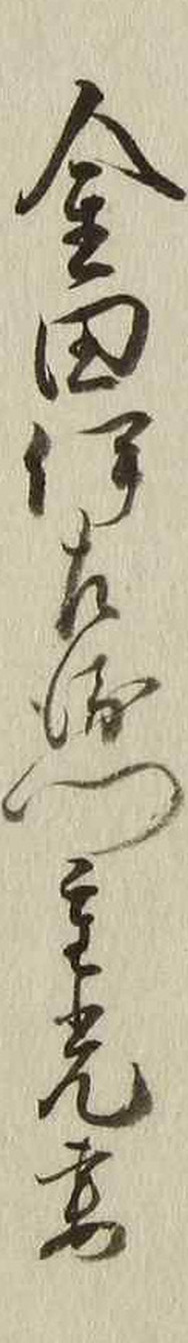女金田伊左衛門重光妻
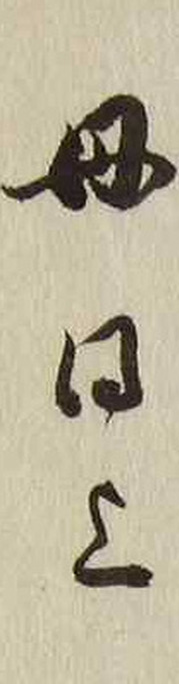母同上
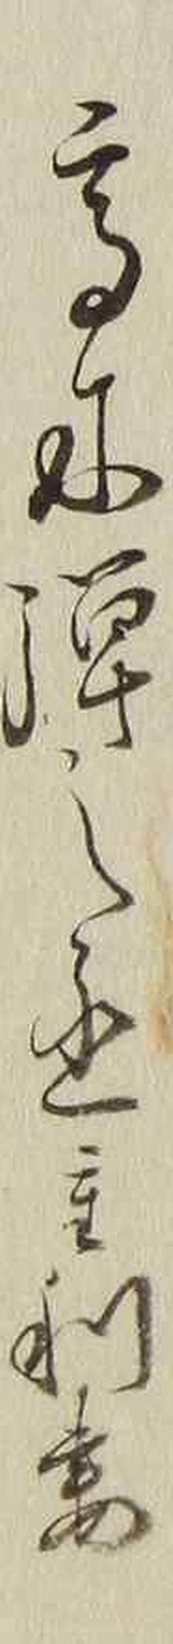女高木弾之丞重利妻
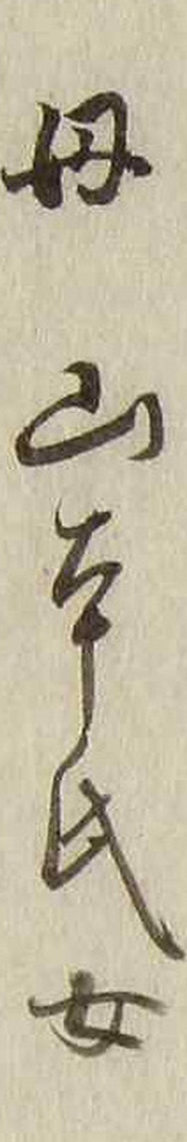母山本氏女

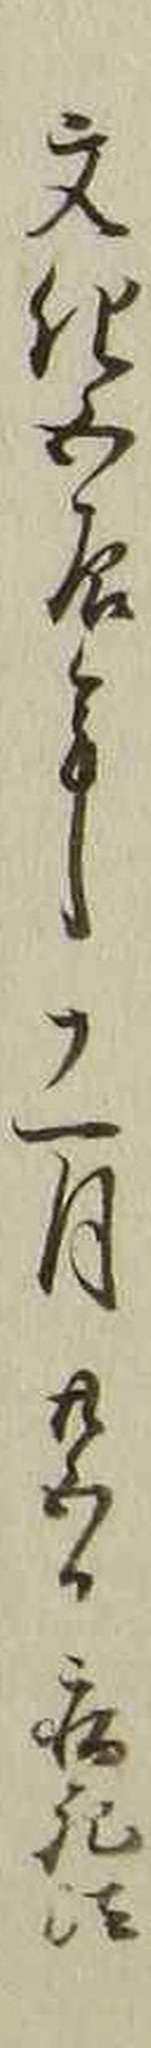文化五辰年十一月廿五日病死法
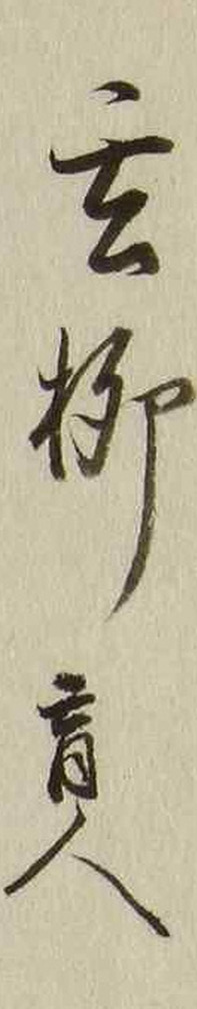玄柳盲人
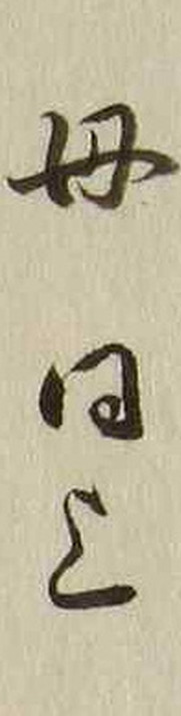母同上
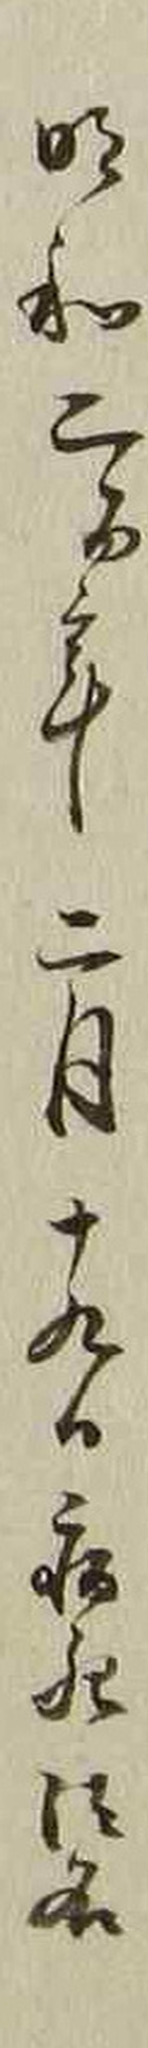明和二酉年二月十九日病死法名
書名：諸士系譜　巻之20　い之部20
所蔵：会津若松市立会津図書館
